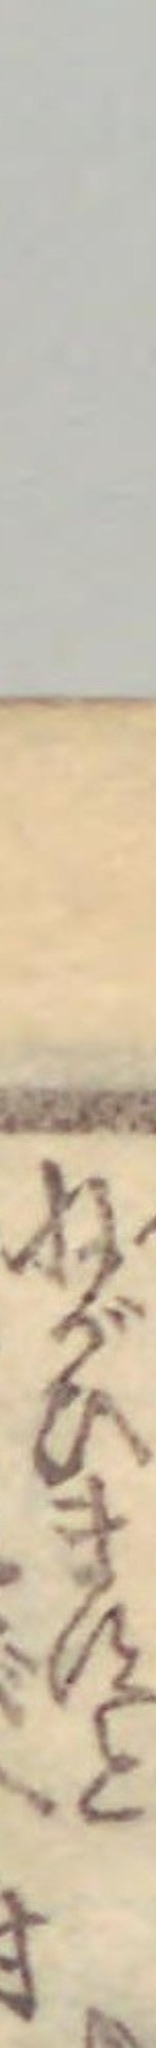ねがひますと
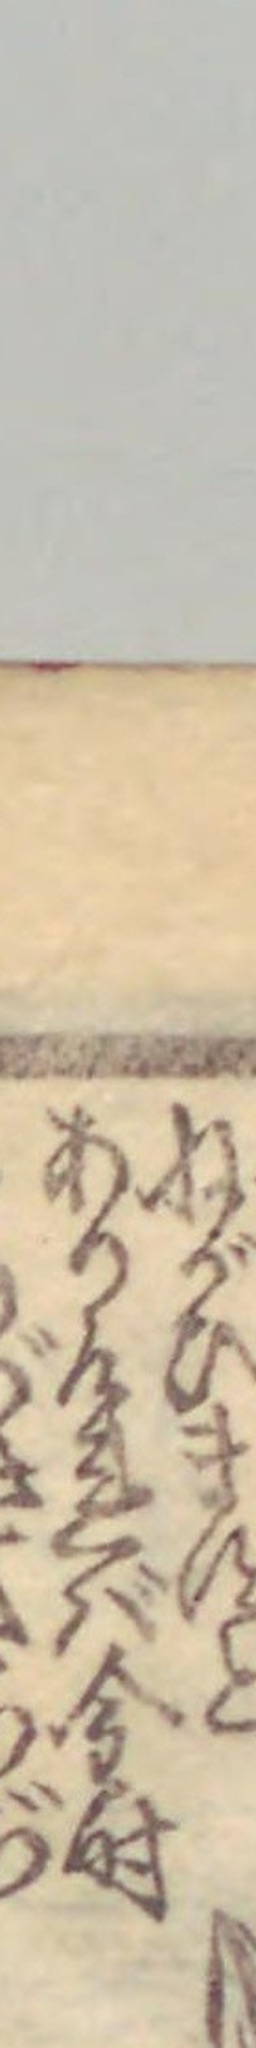ありければ金時
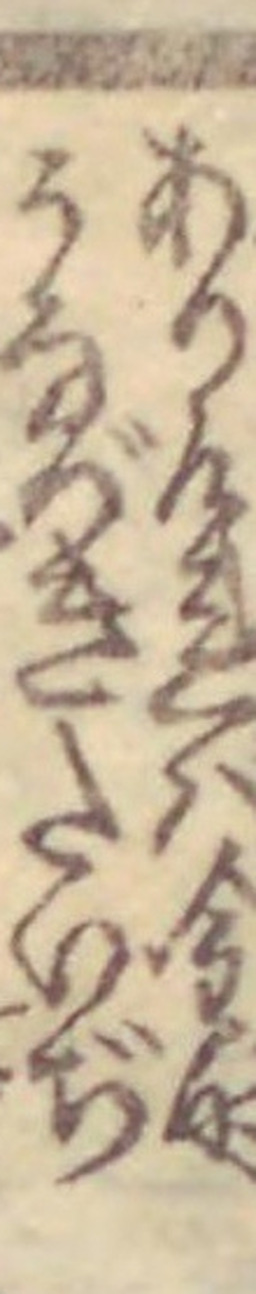うなづきたいぢ
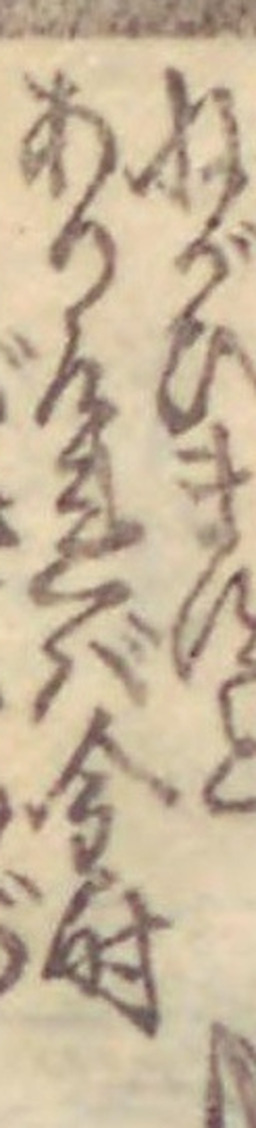ありければ金時
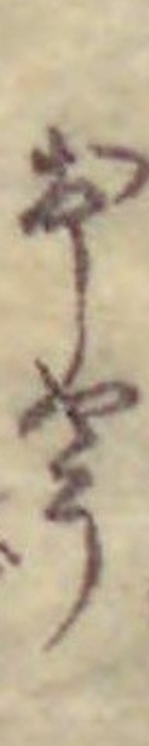おしやう
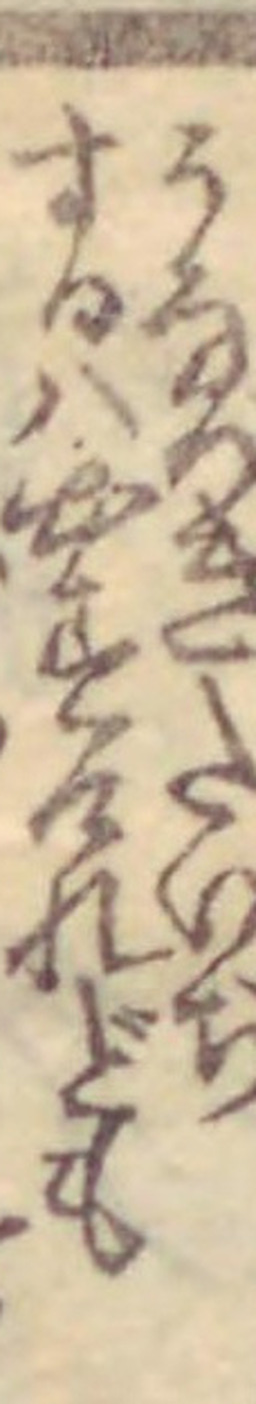するはやすけれども
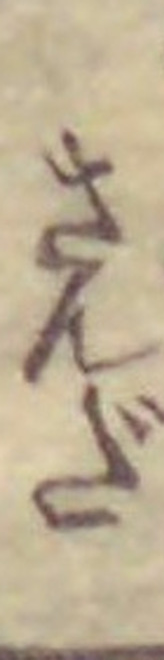さんだ
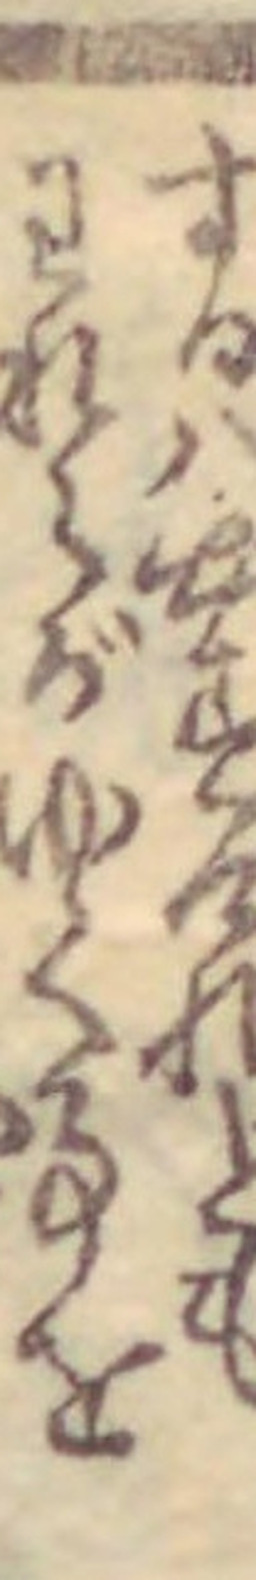われらがゆく事を
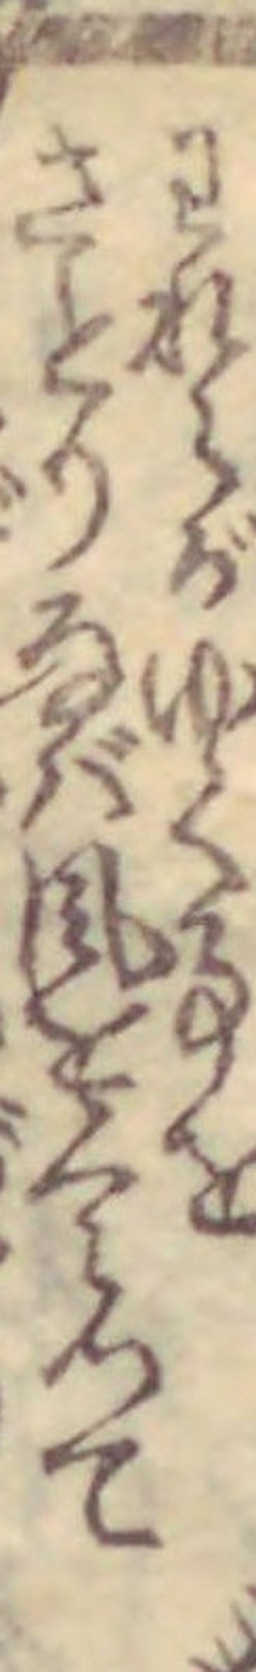さとりなば風をくらつて
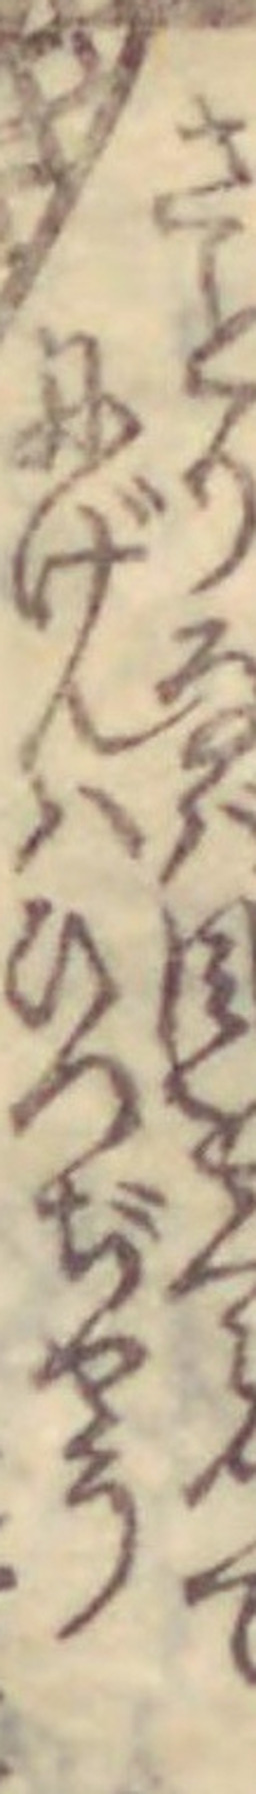にげんはひつぢやう
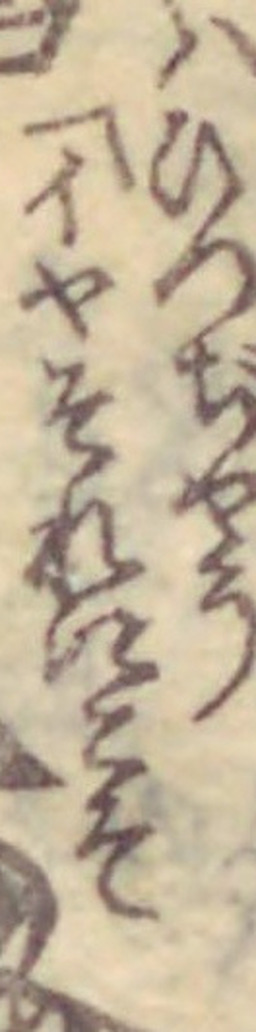〽イヤそれにこそ▲
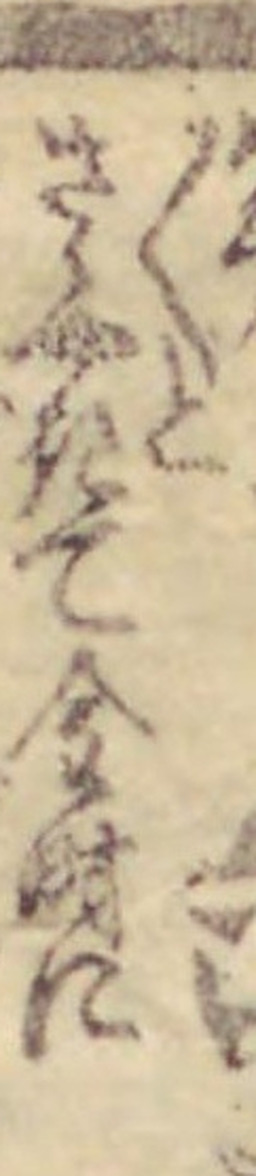さゝやきて金時に
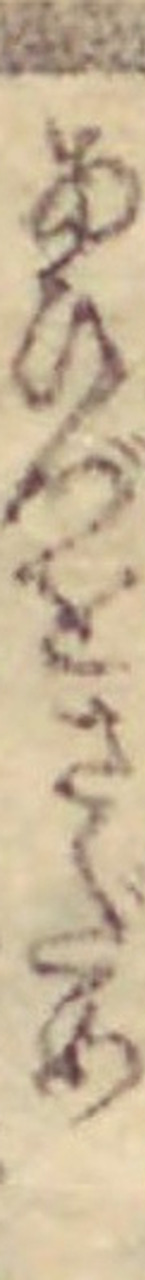あひづをさだめ
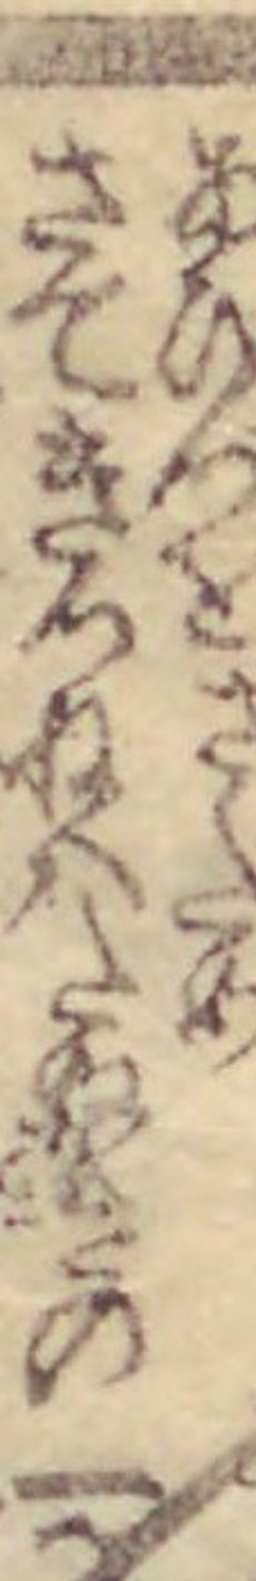さてきつねはたぬきの
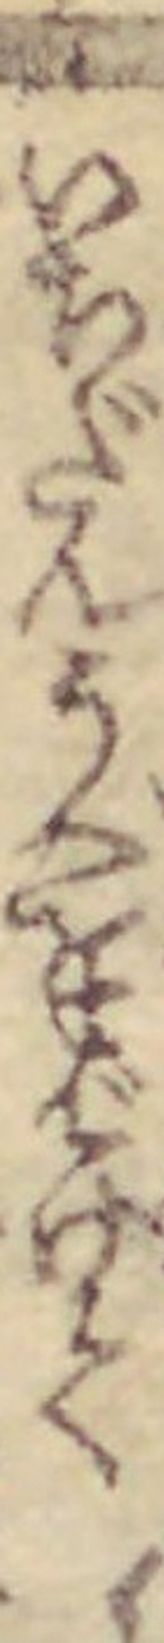いちだんうへをばけて
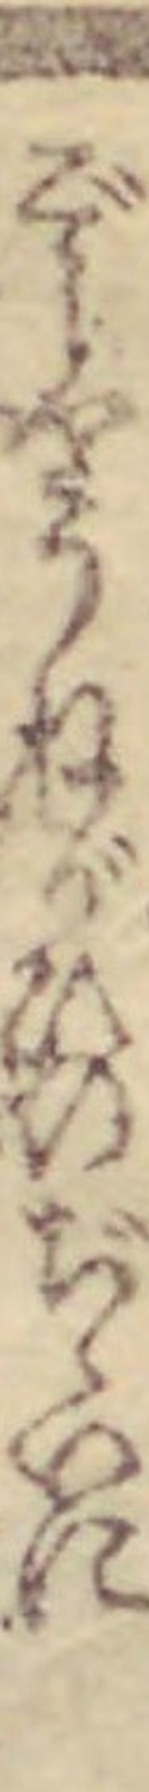ごしやうねがひのぢゝいに
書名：化物世帯氣質
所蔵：国立国会図書館 National Diet Library, JAPAN
